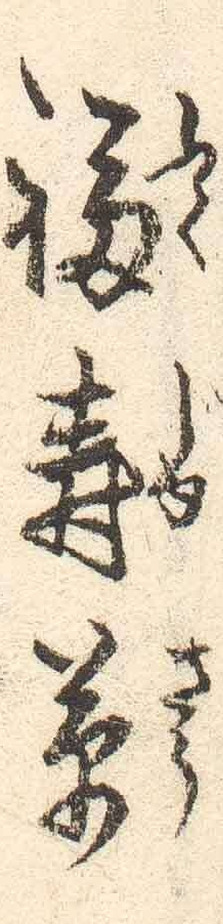福寿草
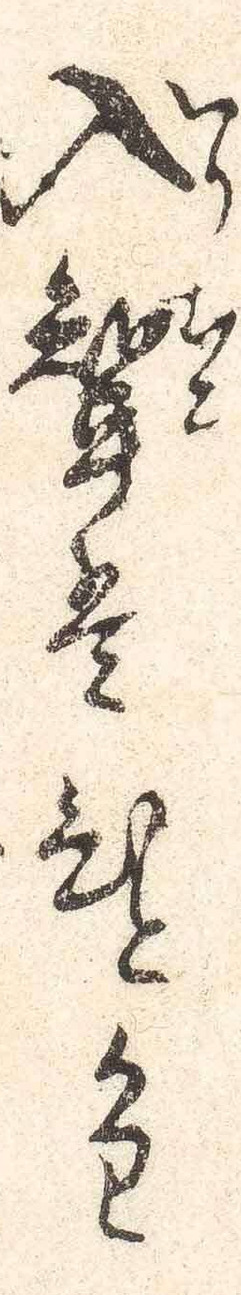入聟はひとかわ
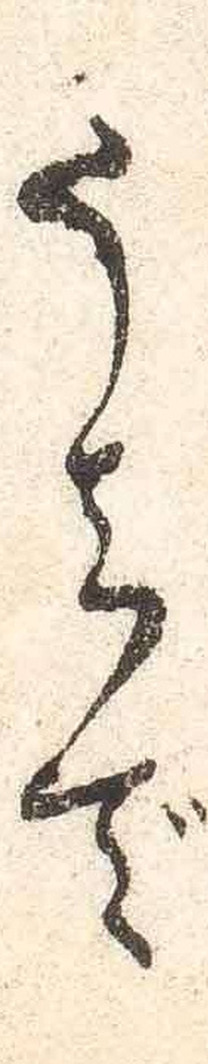うちで
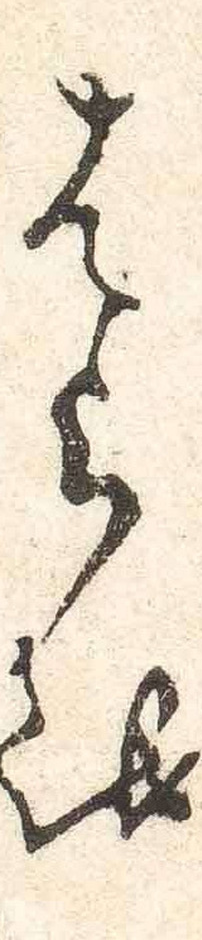はらを
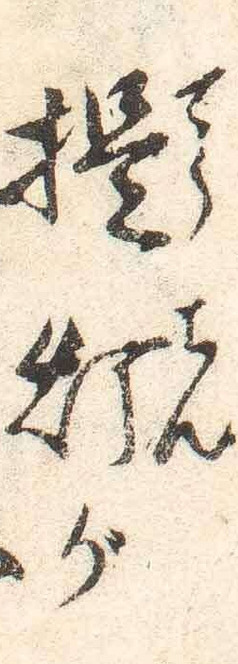提灯が
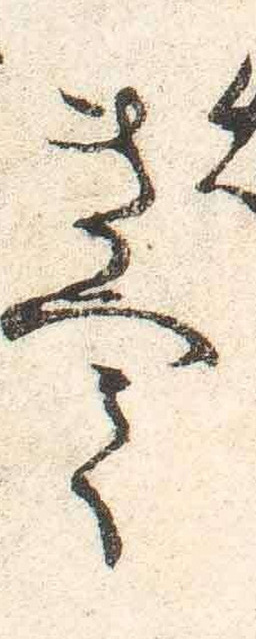きへて
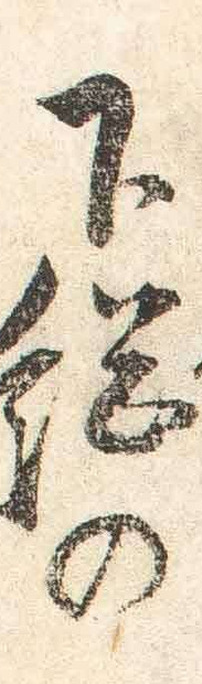下総の
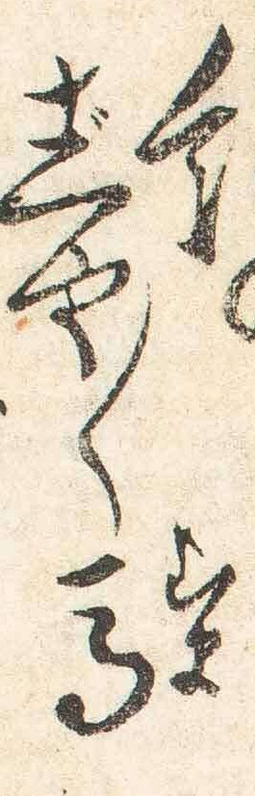じや〳〵馬
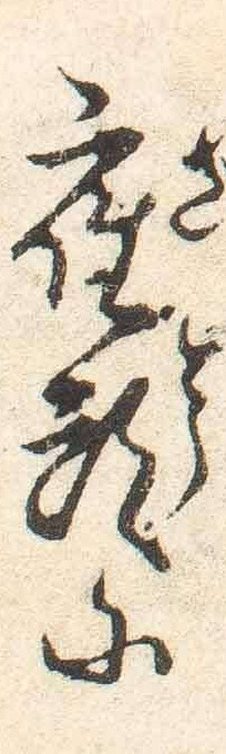座頭に
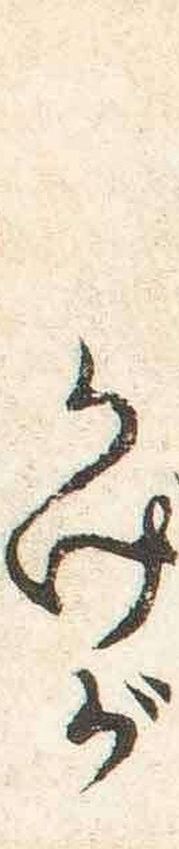かげが
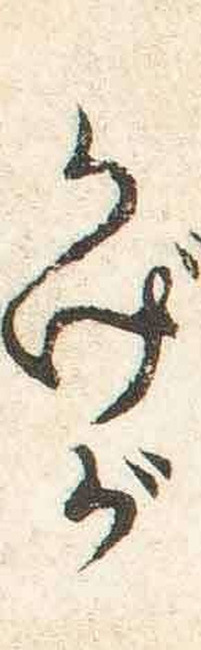かげが
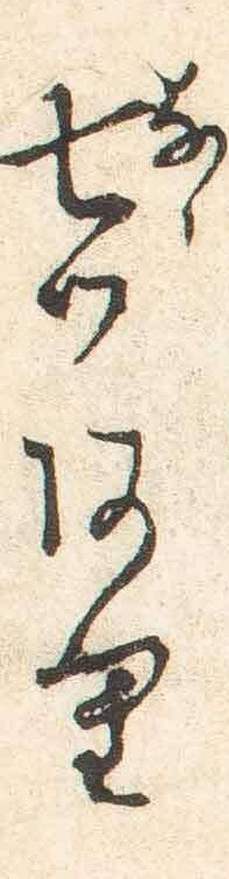七つあり
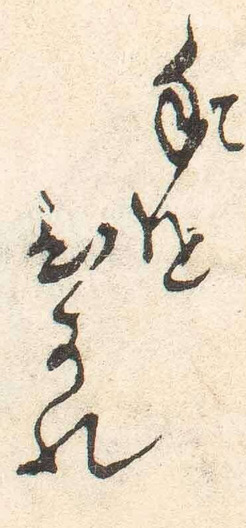ひかれ
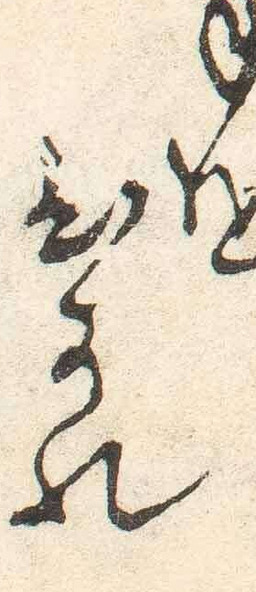ひかれ

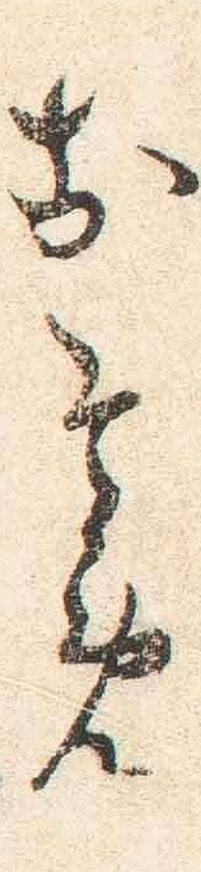おそめ
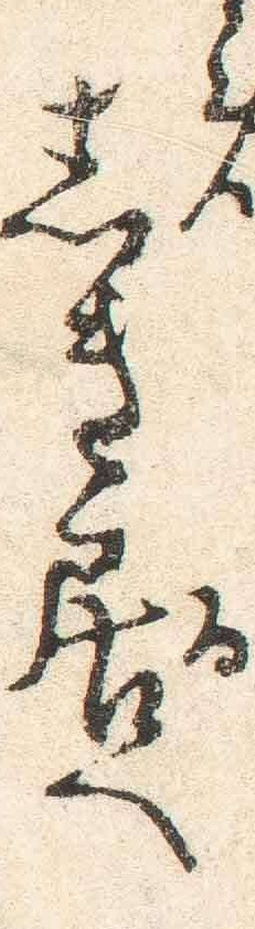しき居へ
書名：画本柳樽
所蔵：東京学芸大学附属図書館 国文学研究資料館
